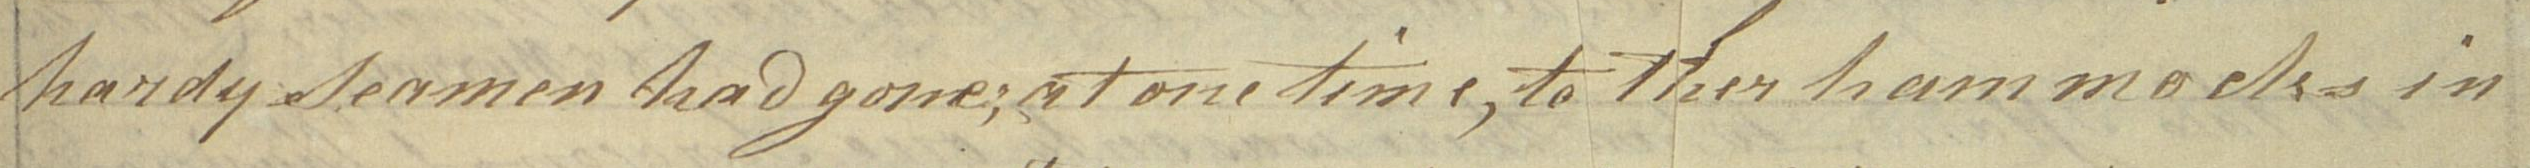hardy seamen had gone; at one time, to ther hammocks in
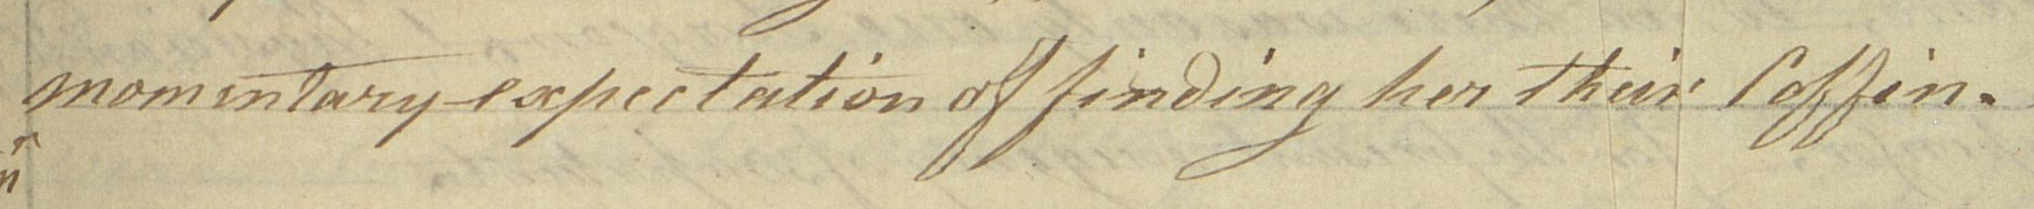momentary expectation of finding her their Coffin.
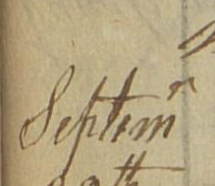Septem^r
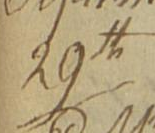29^th
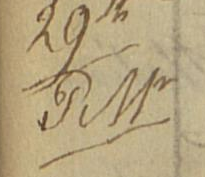PM
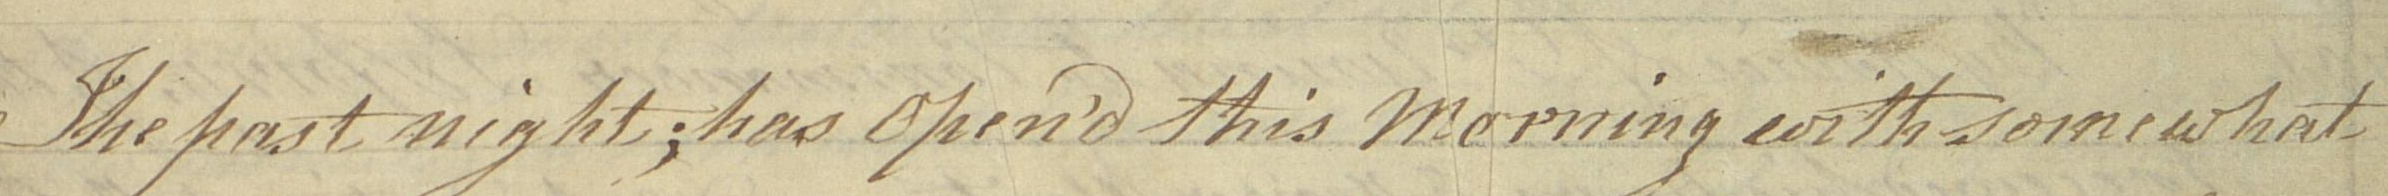The past night; has open'd this morning with somewhat
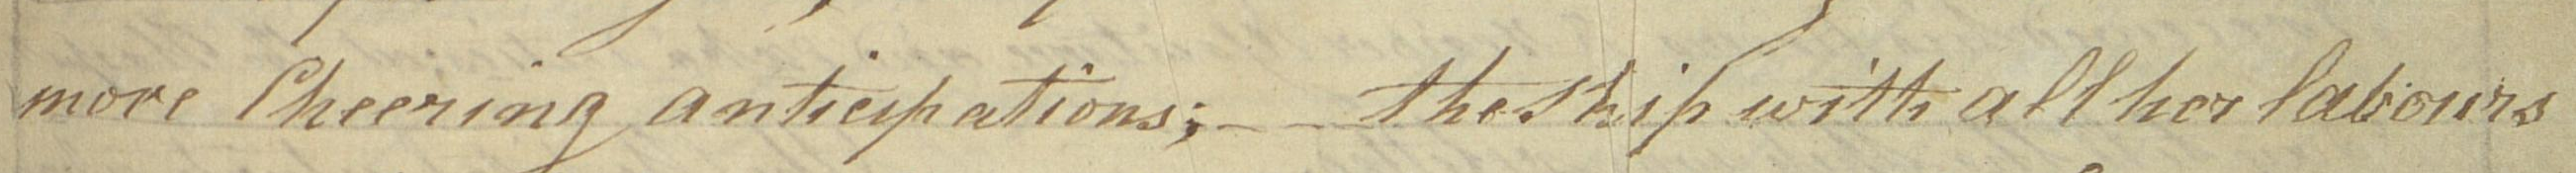more Cheering anticipations; The ship with all her labours
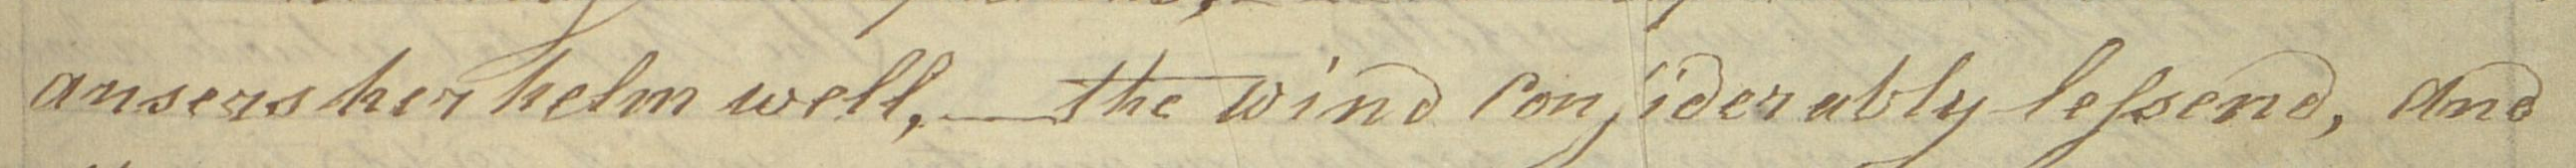ansers her helm well, the wind considerably lessend, And
